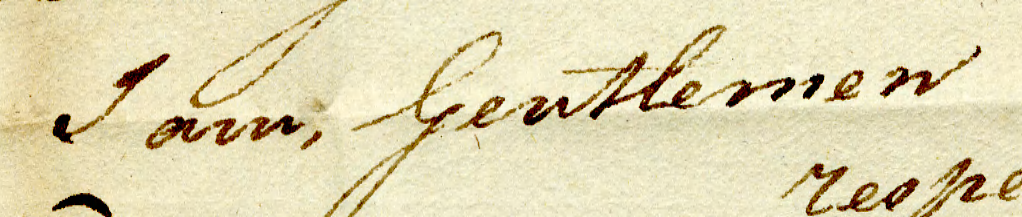I am, Gentlemen
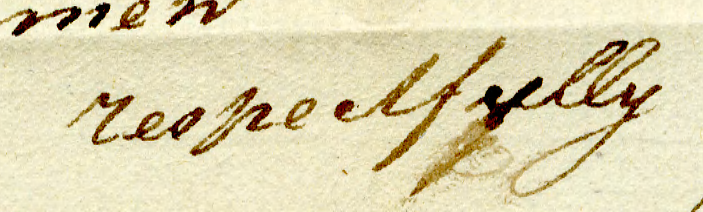respectfully
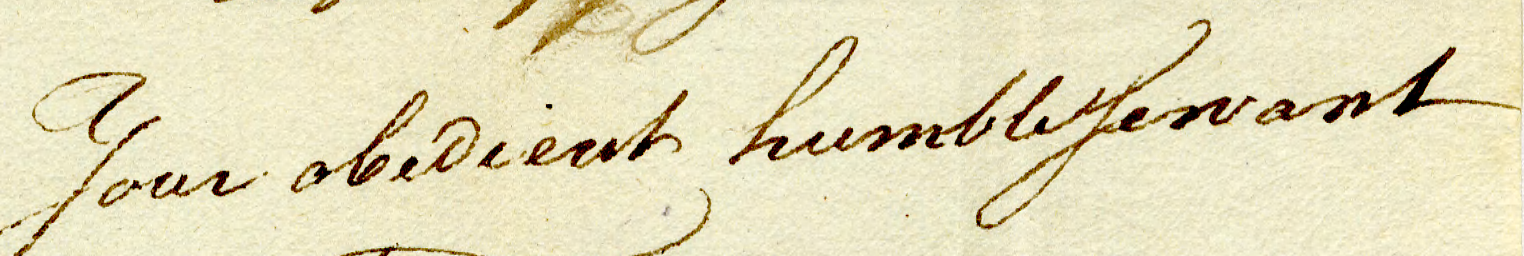Your obedient humble servant
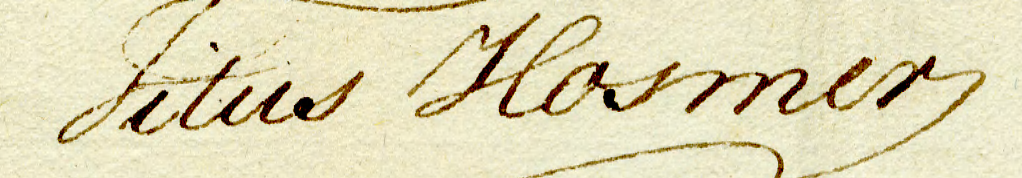Titus Hosmer
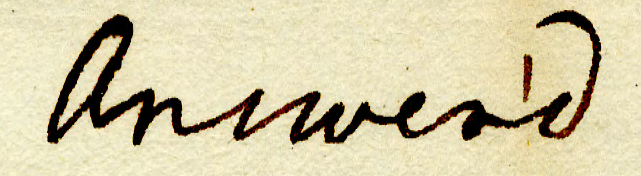Answer'd
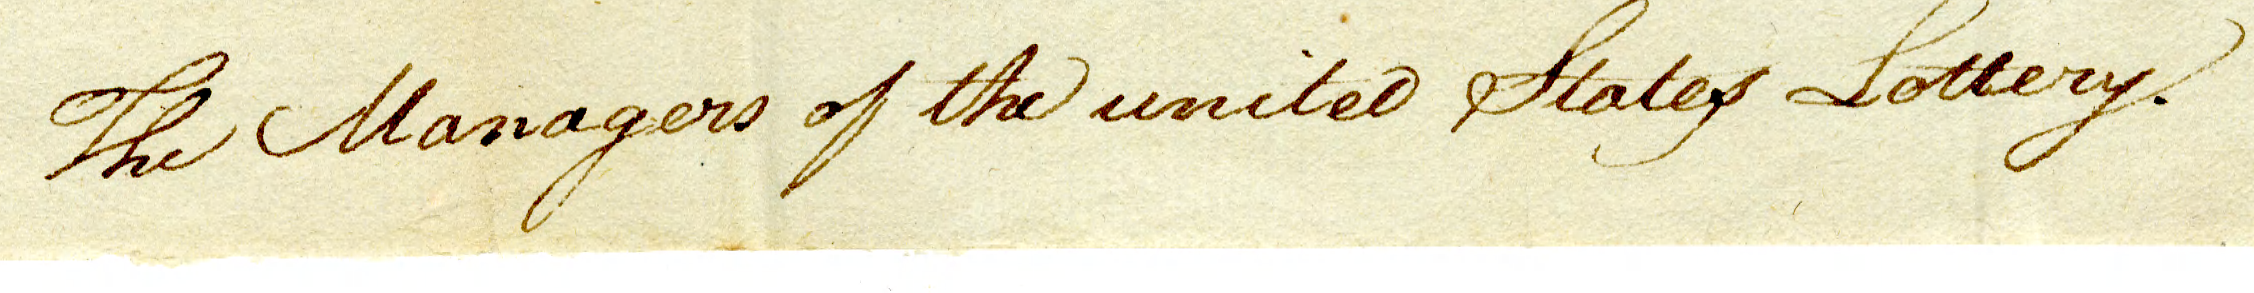The Managers of the united States Lottery
